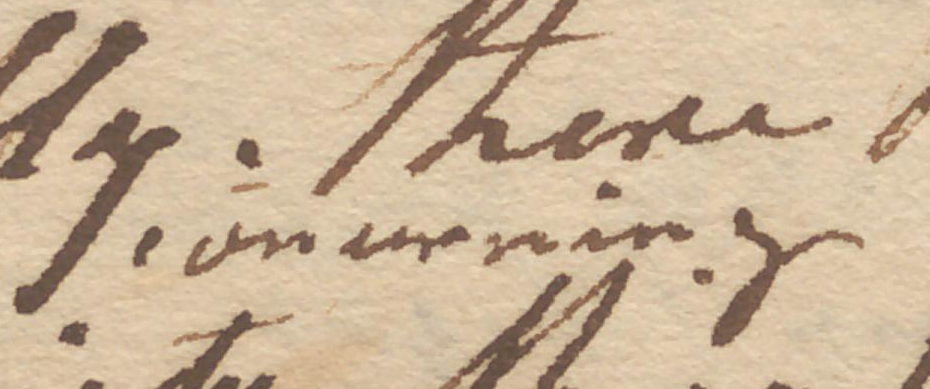concerning
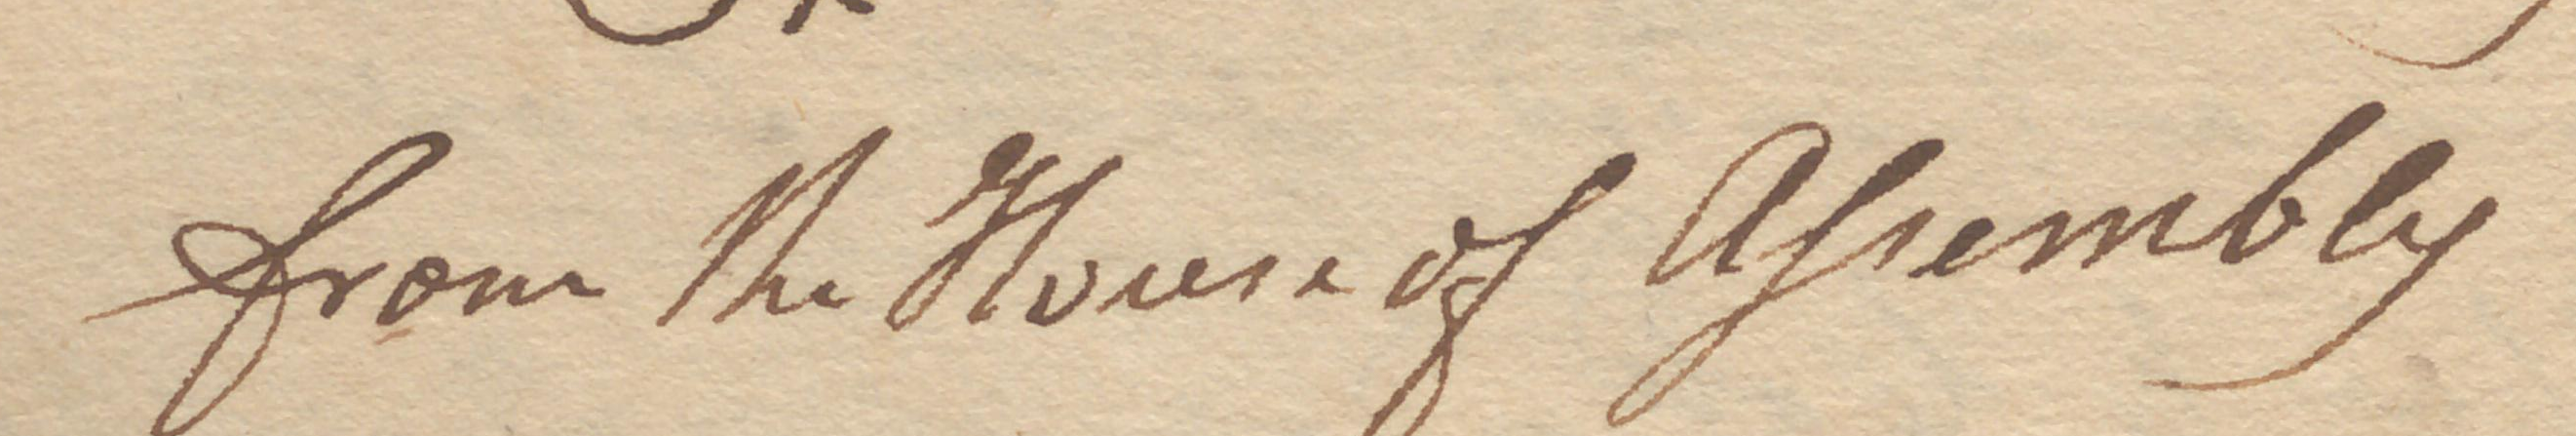from the House of Assembly
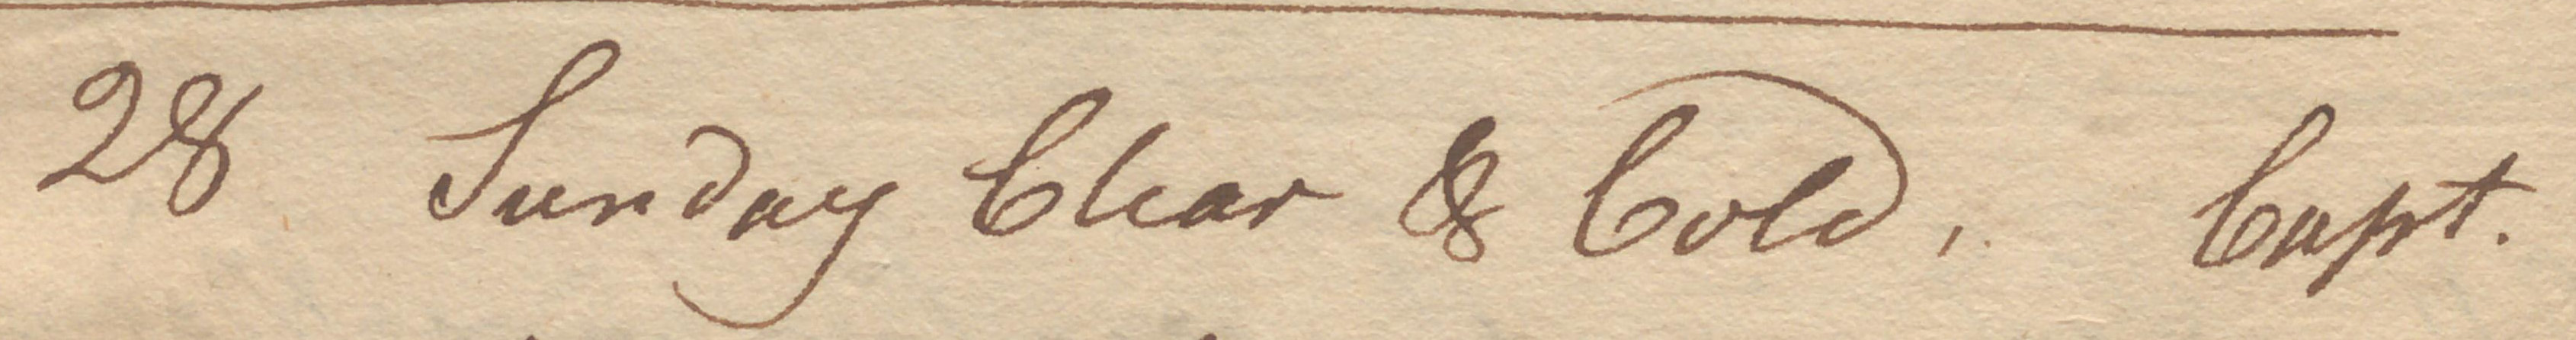28 Sunday Clear & Cold. Capt.
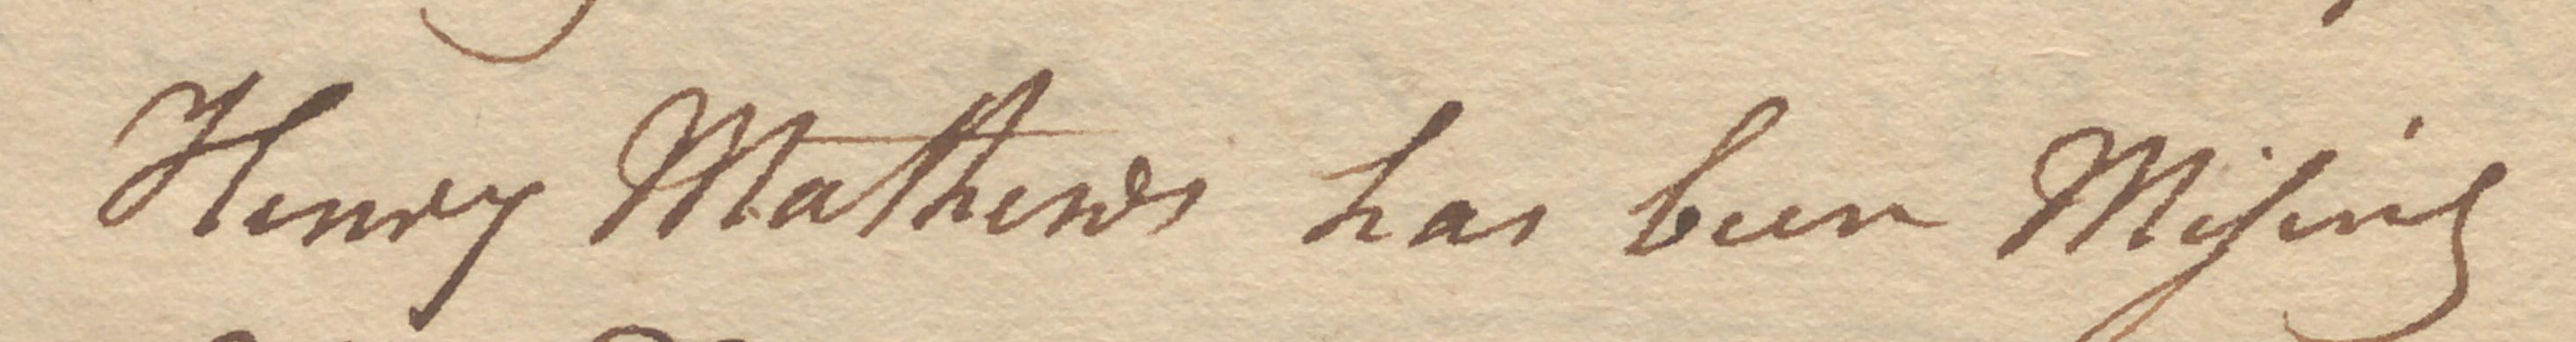Henry Mathews has been Missing
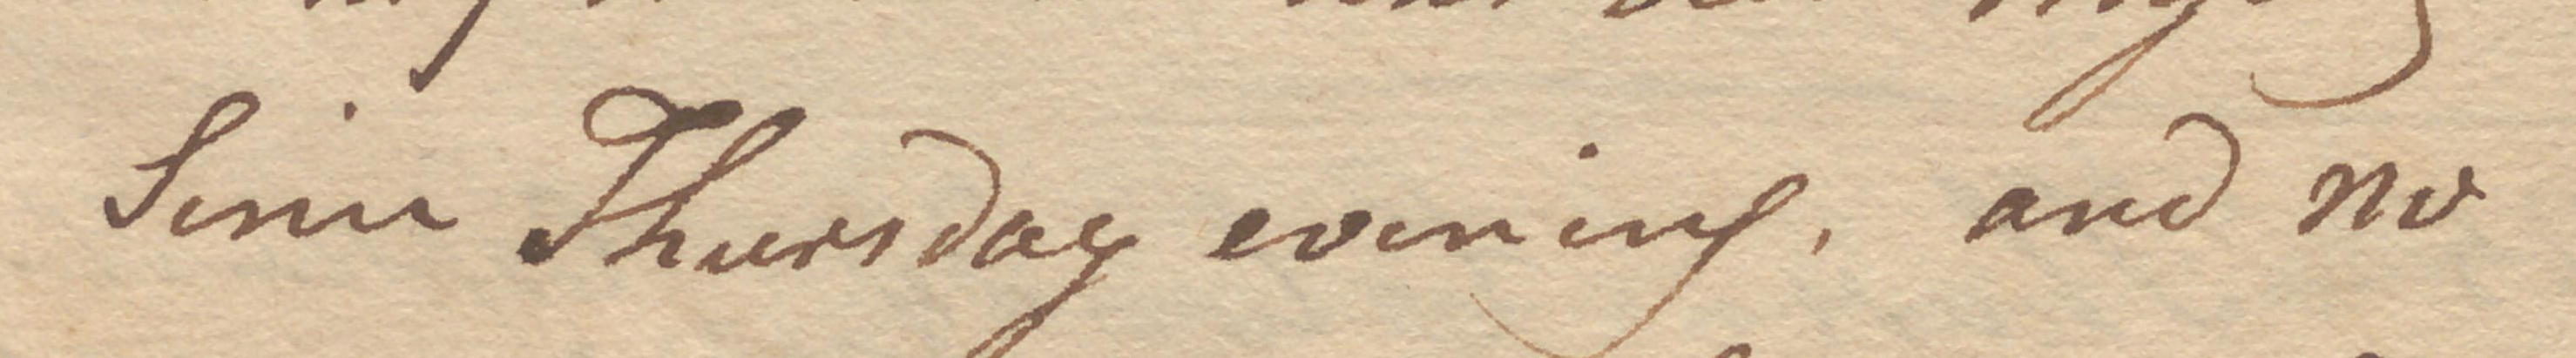Since Thursday evening, and no
